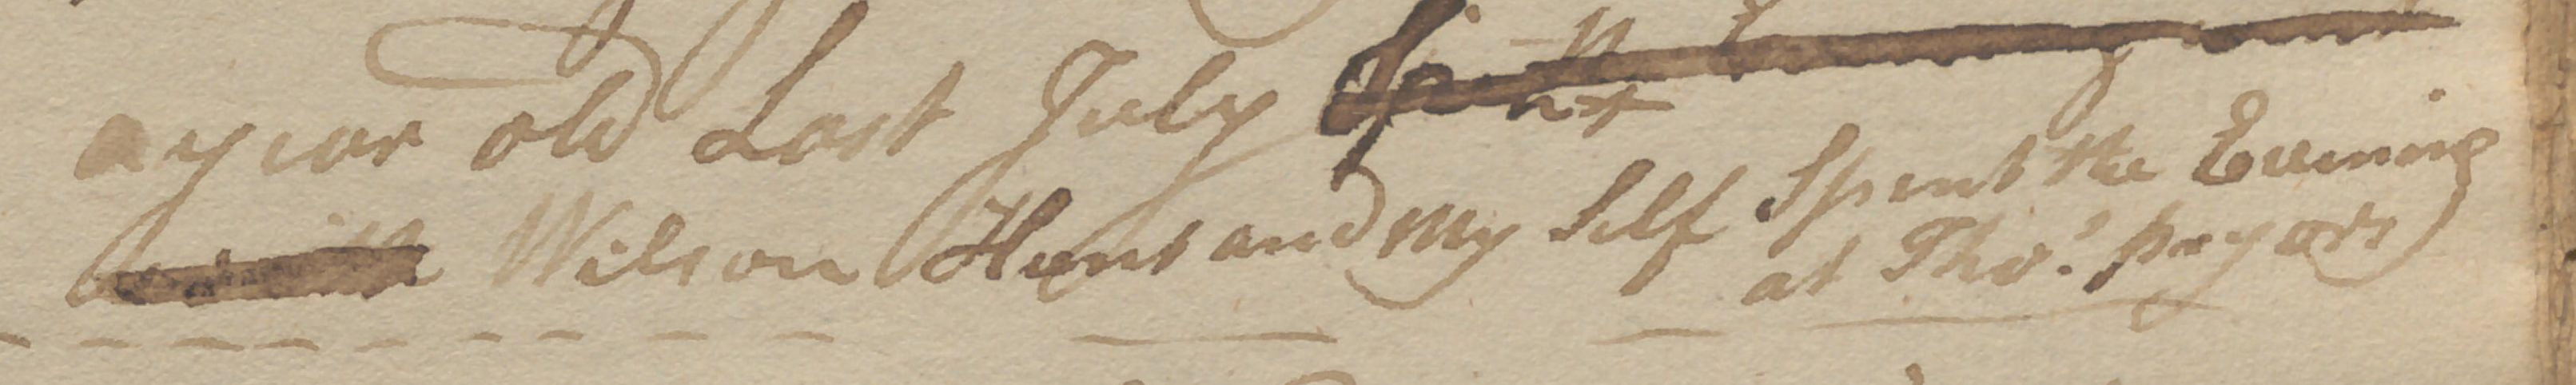[_____] Wilson Hunt and My Self spent the Evening
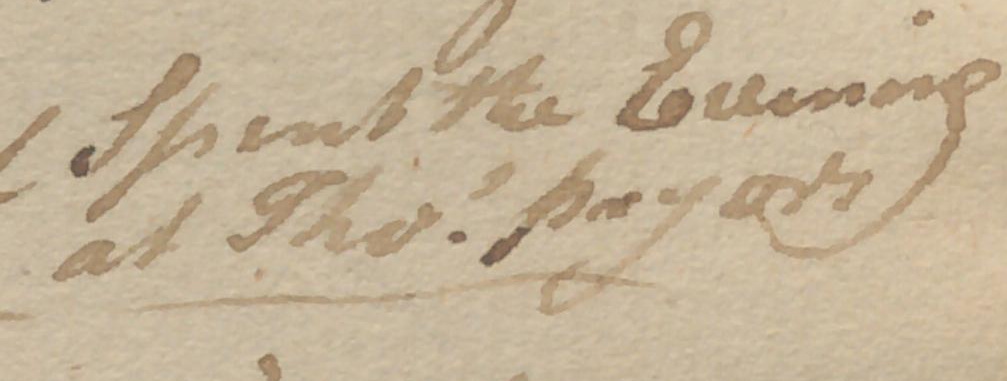at Tho^s. pryors
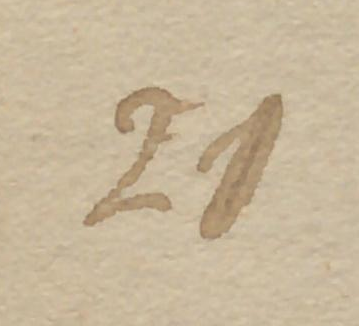21
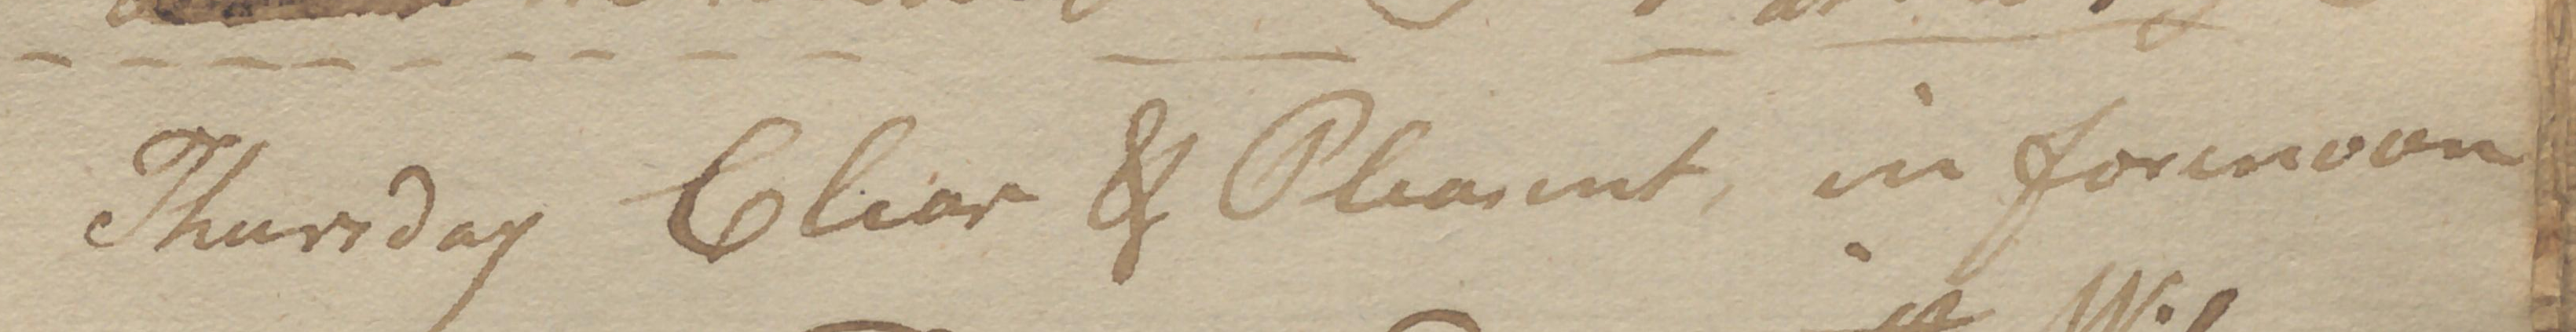Thursday Clear & Pleasent, in forenoon
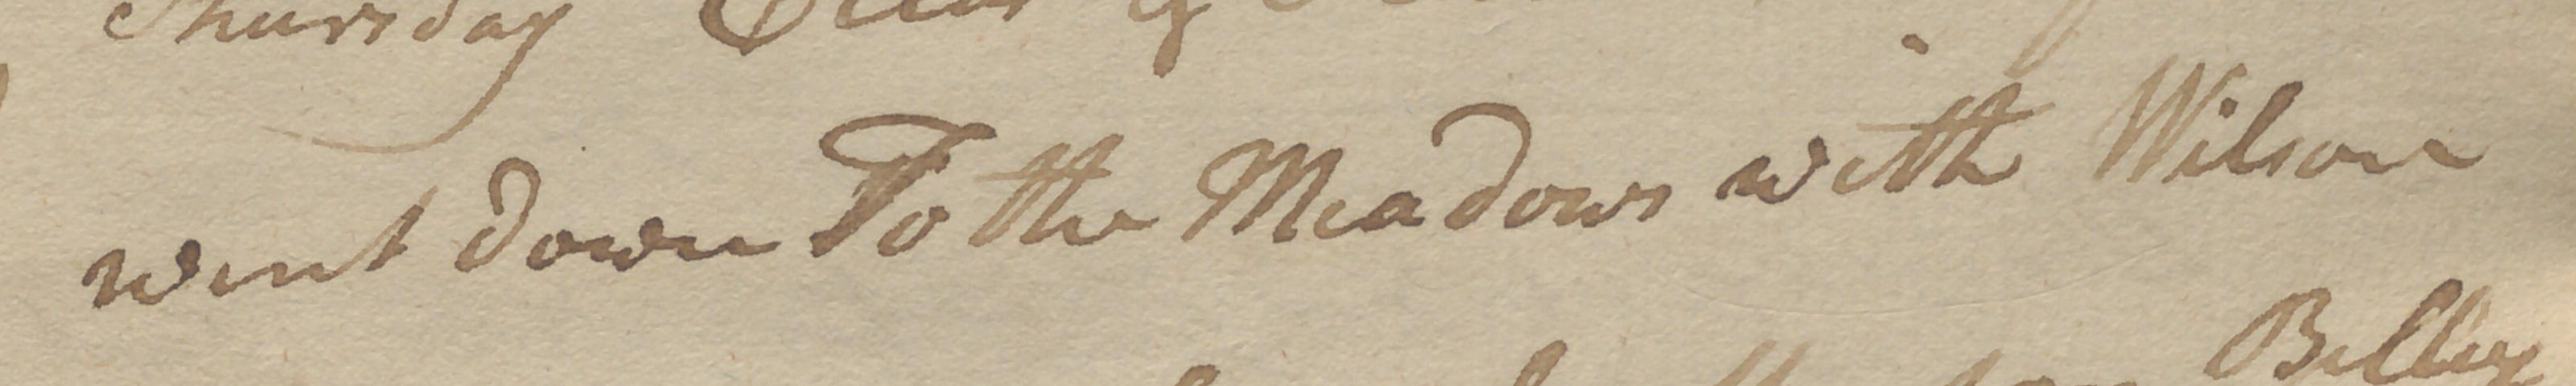went down To the Meadows with Wilson
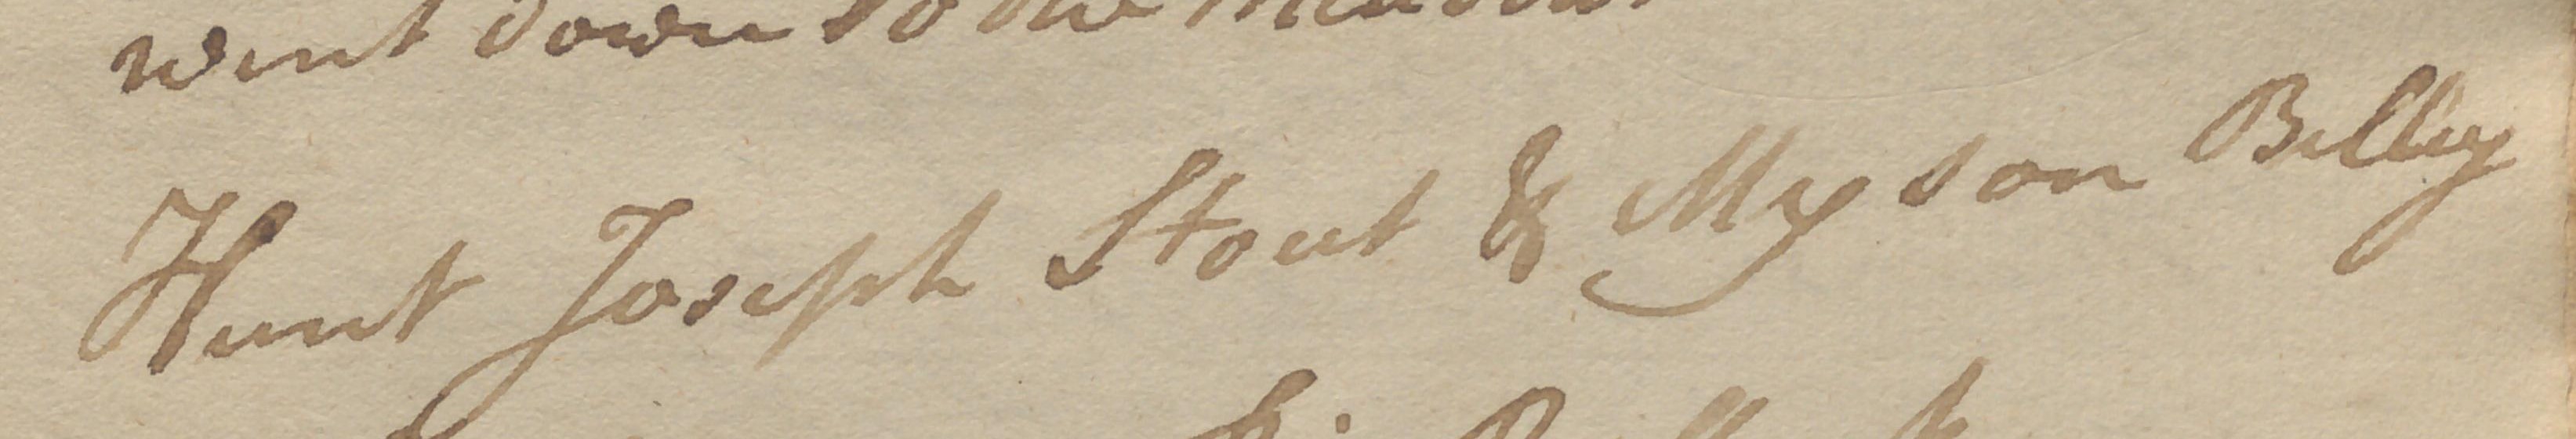Hunt Jooeph Stout & My son Billey
